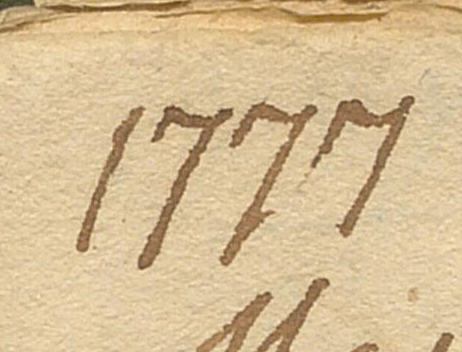17777
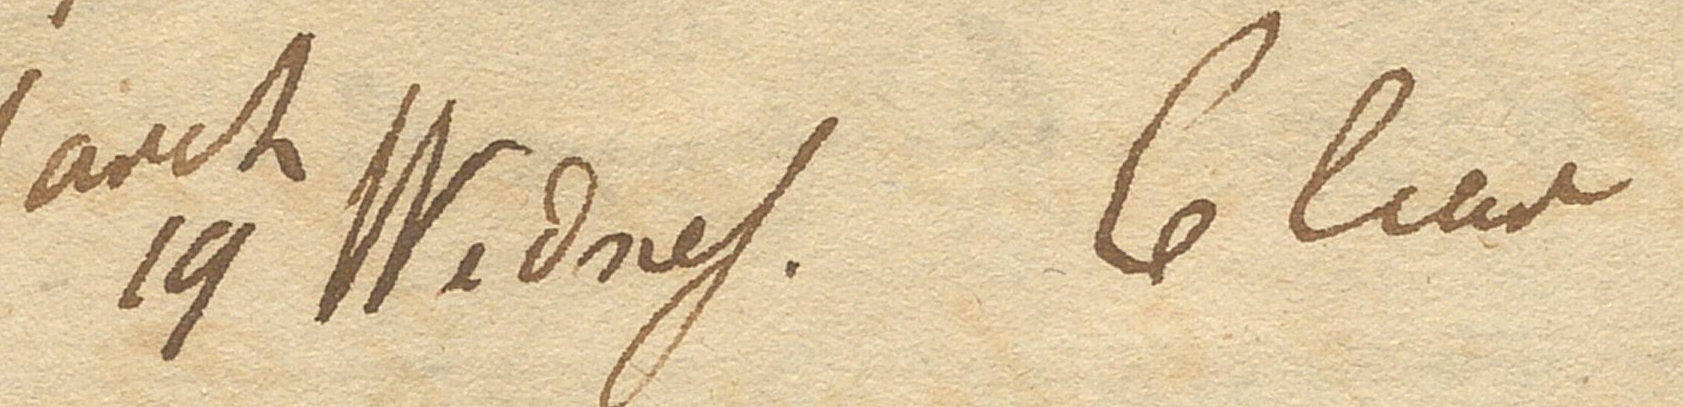19 Wednes. Clear
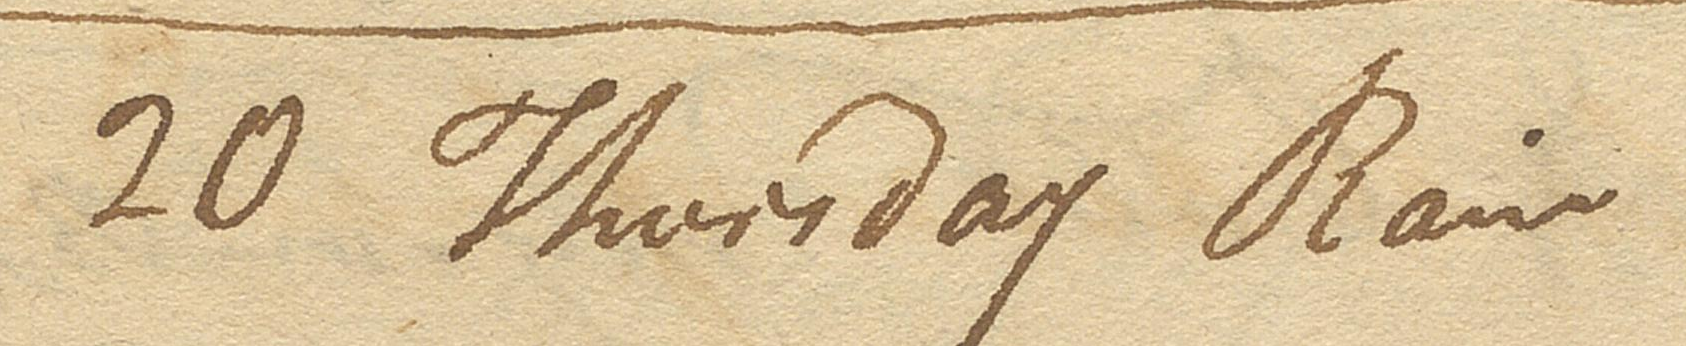20 Thursday Rain
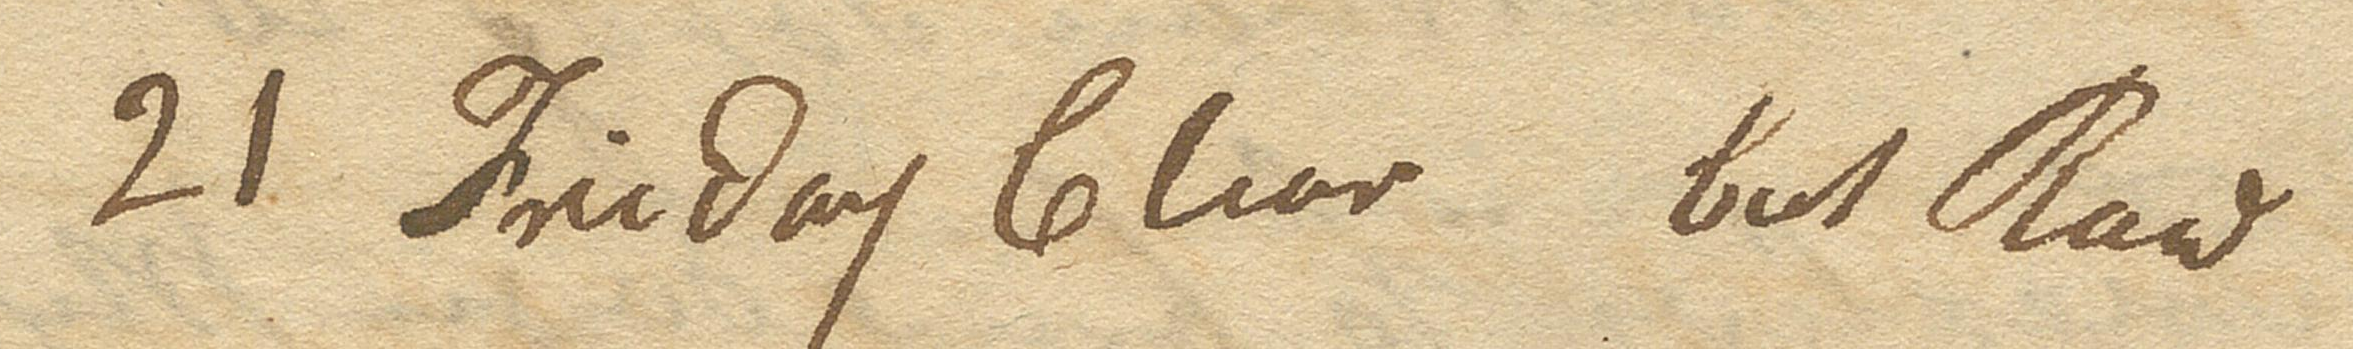21 Friday Clear but Raw
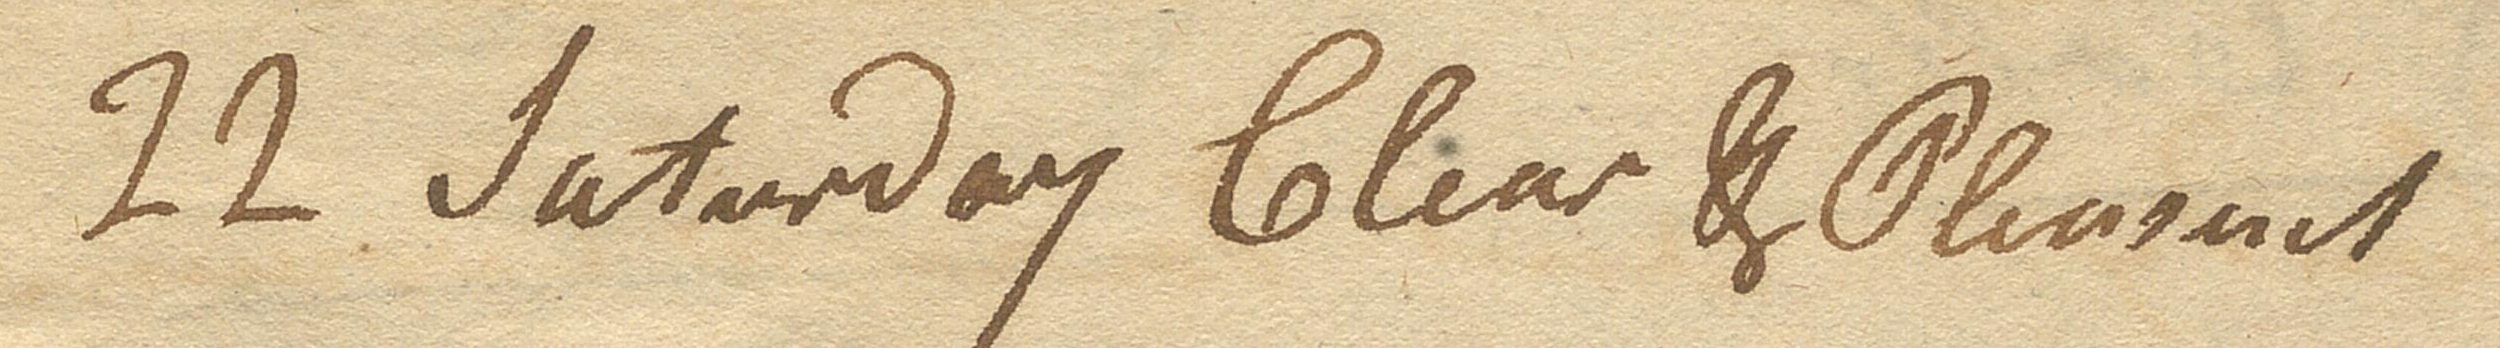22 Saturday Clear & Pleasent
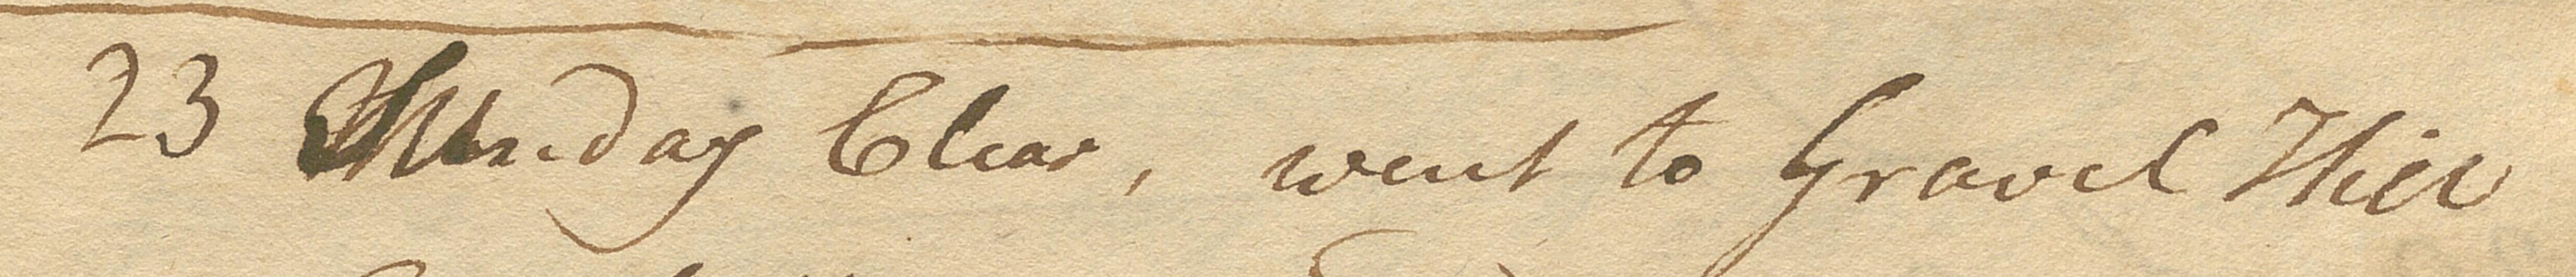23 Sunday Clear, went to Gravel Hill
